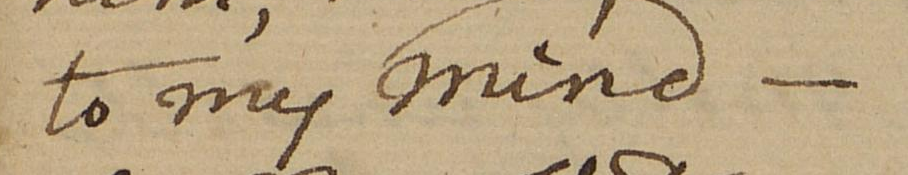to my mind-
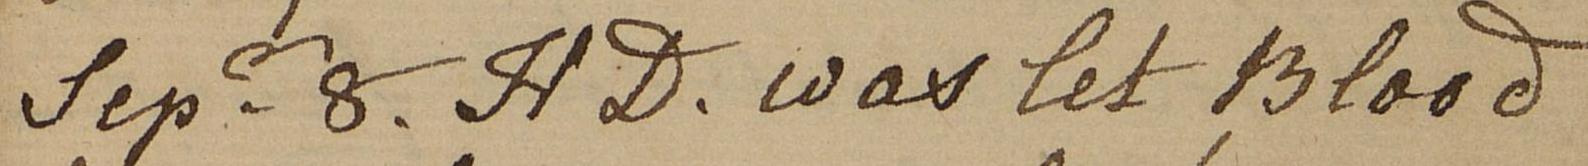Sep^r. 8. HD. was let Blood
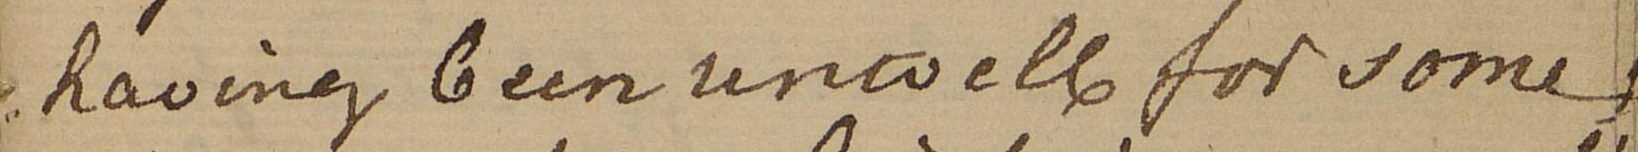having ben unwell for some
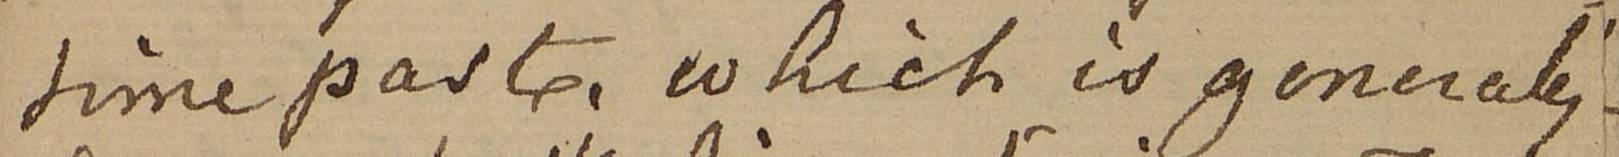time past, which is generaly
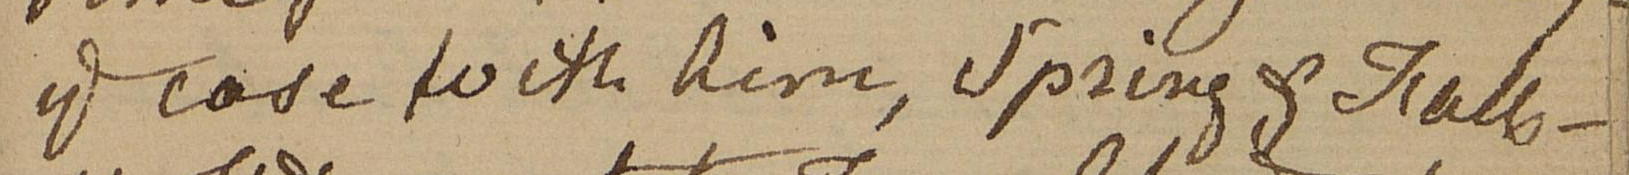y^e case with him, Spring & Fall-
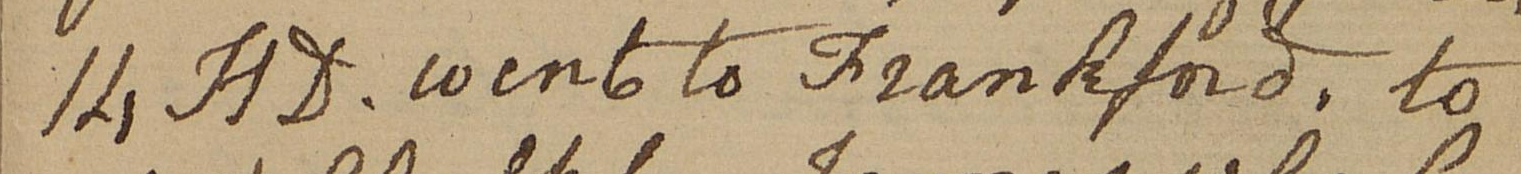14 HD. went to Frankford, to
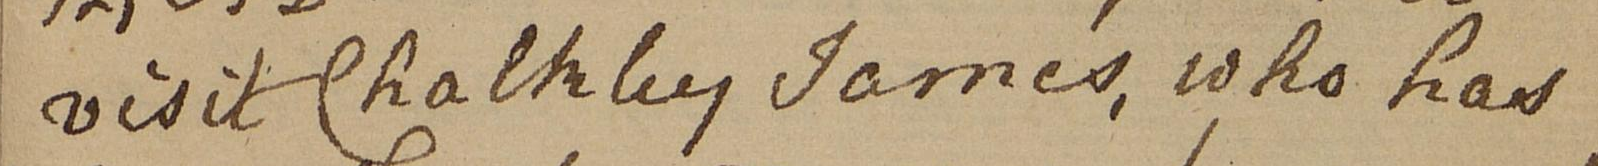visit Chalkley James, who has
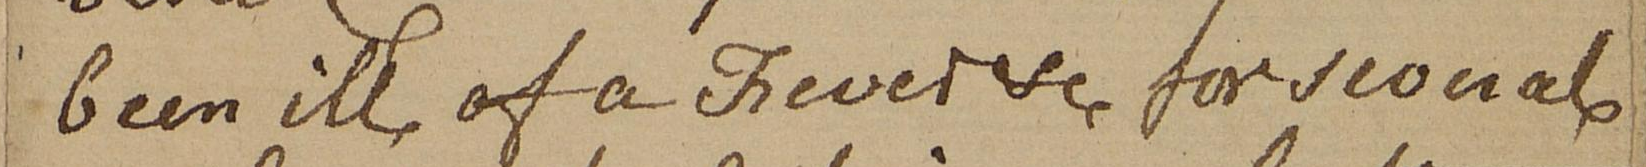been ill of a Fever &c for several
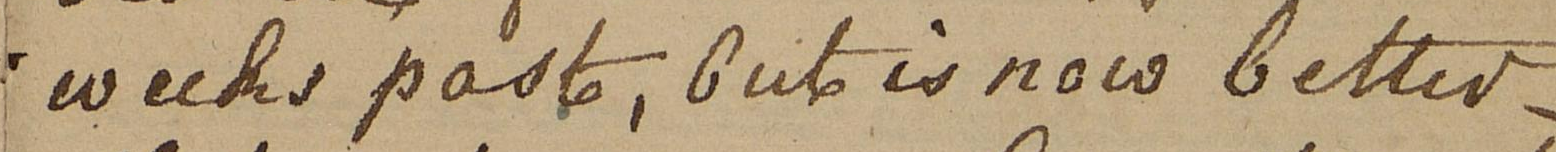weeks past, but is now better-
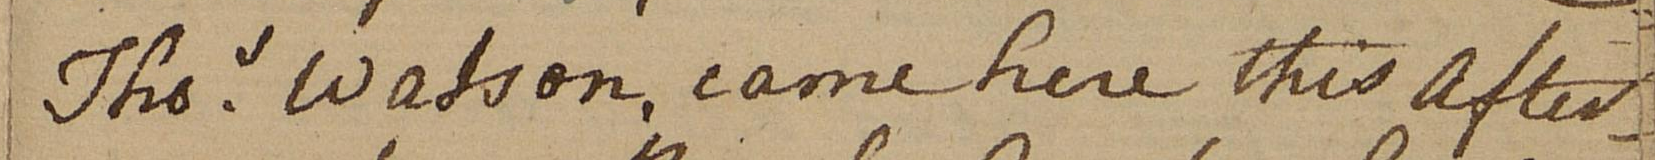Tho^s. Watson, came here this After
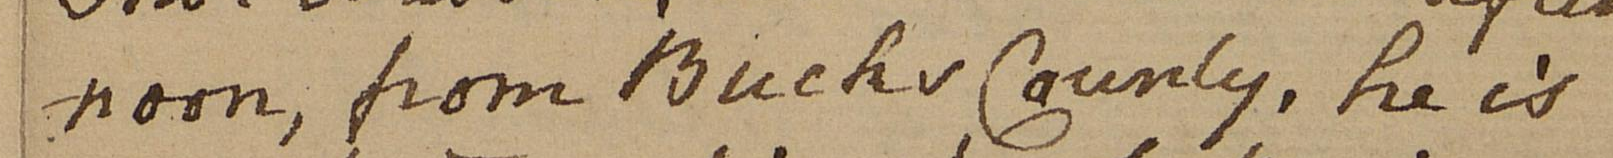-noon, from Bucks County, he is
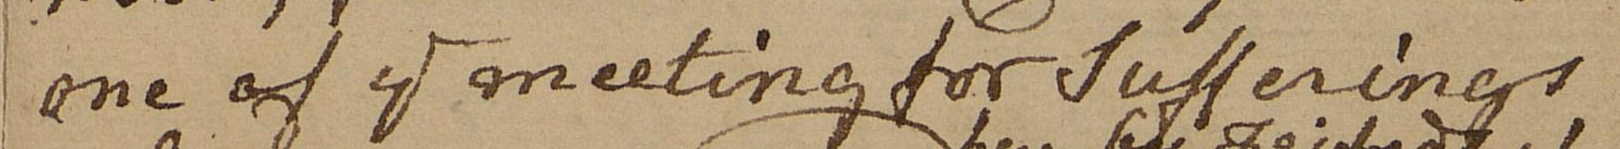one of y^e meeting for Sufferings,
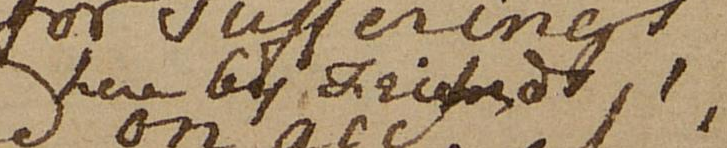here by Friends
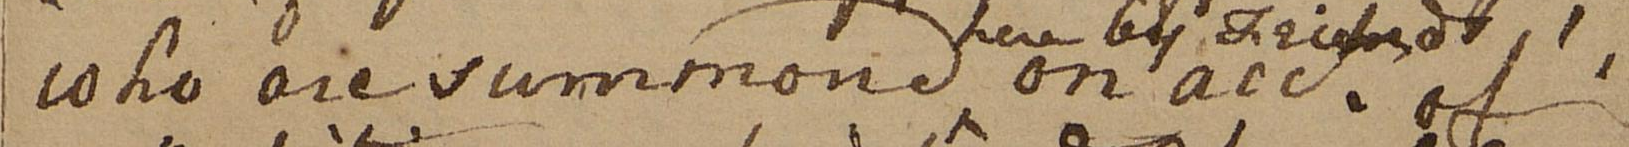who are summond on acc^t. of
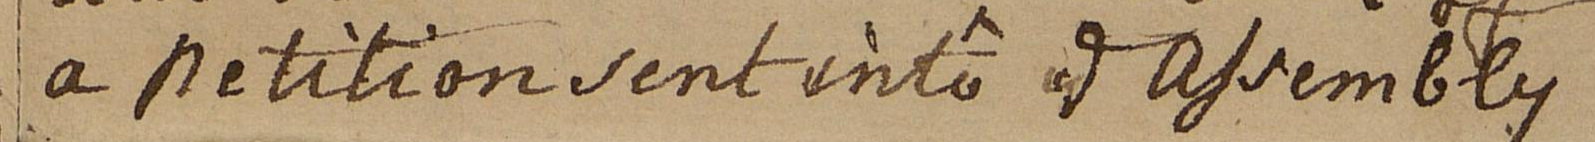a petition sent into^t y^e Assembly
